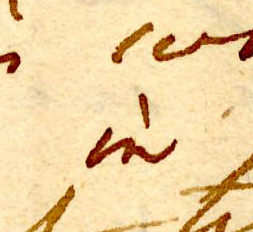in
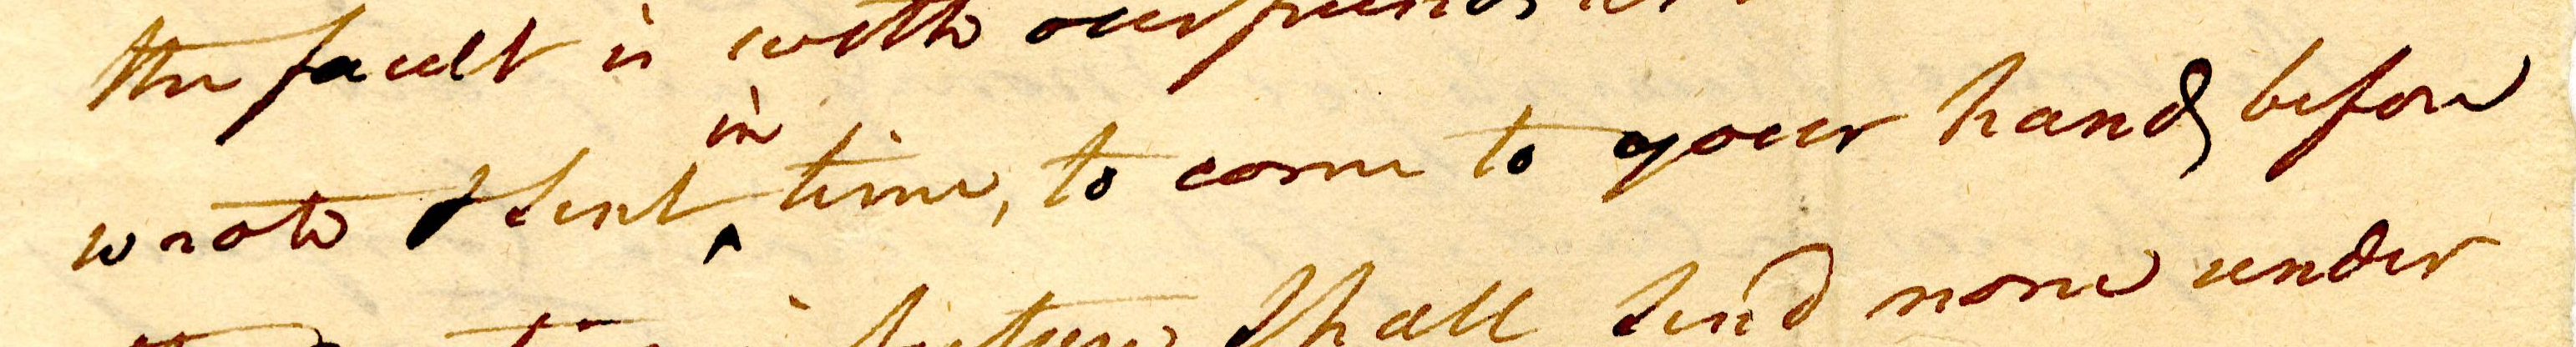wrote & sent ^ time, to come to your hand before
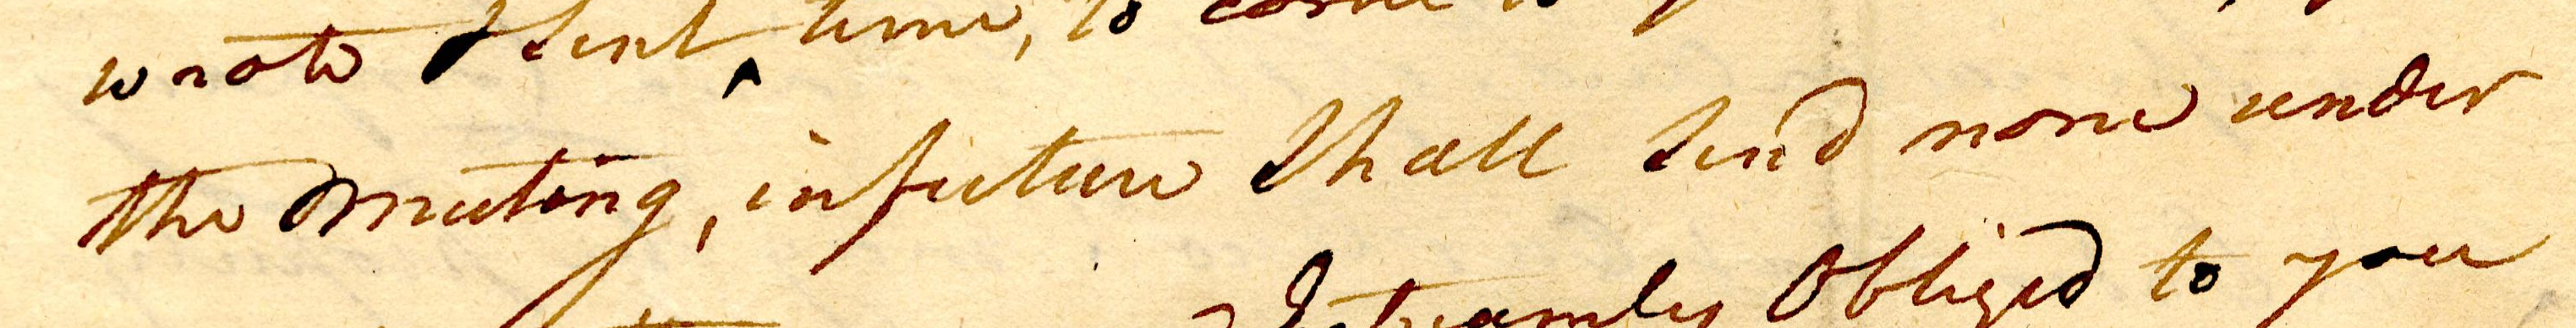the meeting, in sixteen Shall Send more under
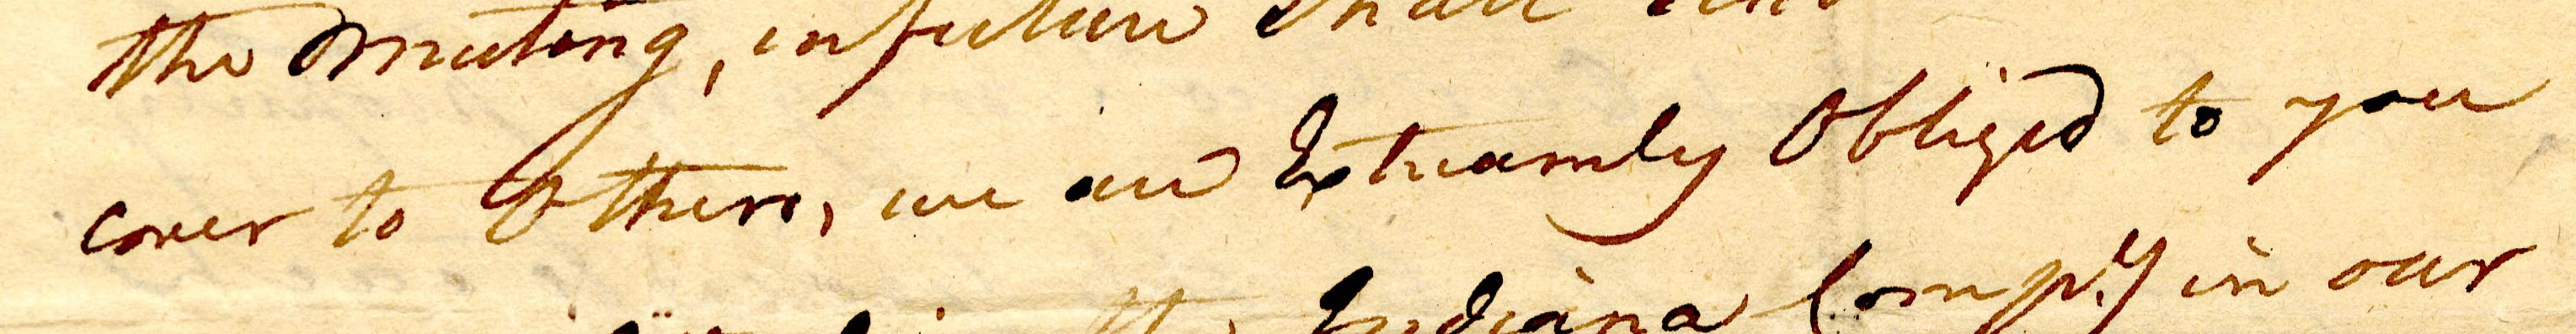cover to others, we are Extreamly obliged to you
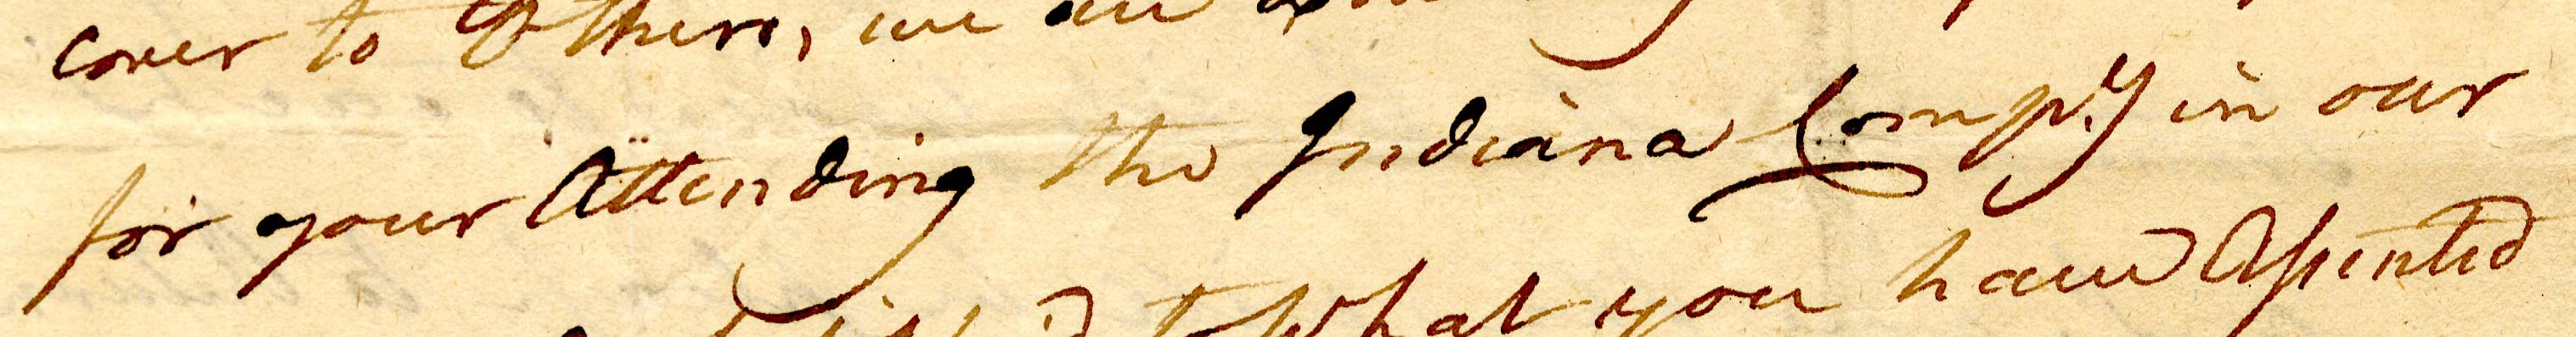for your Attending the Indiana Comp^y. in our
